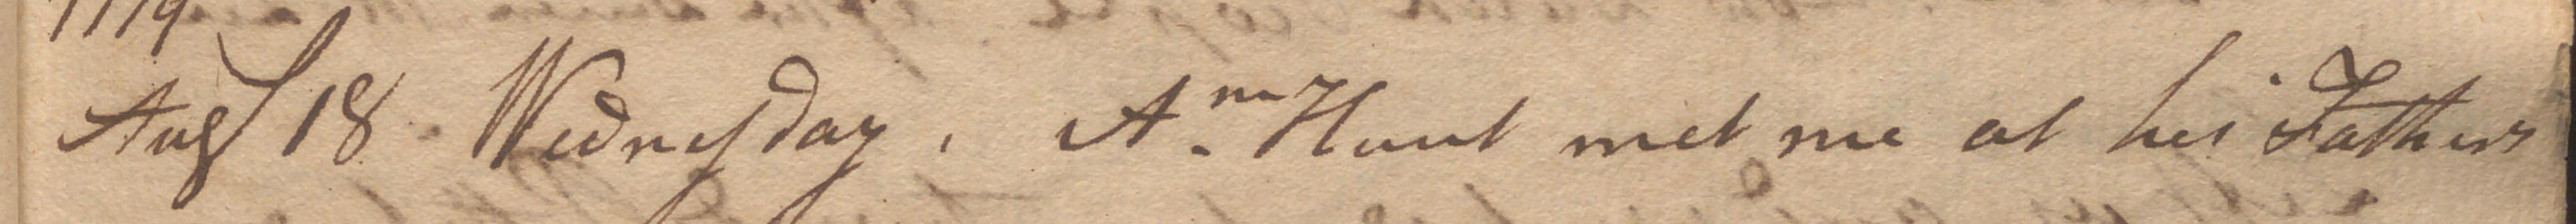Aug 18. Wednesday. A^m. Hunt met me at his Fathers
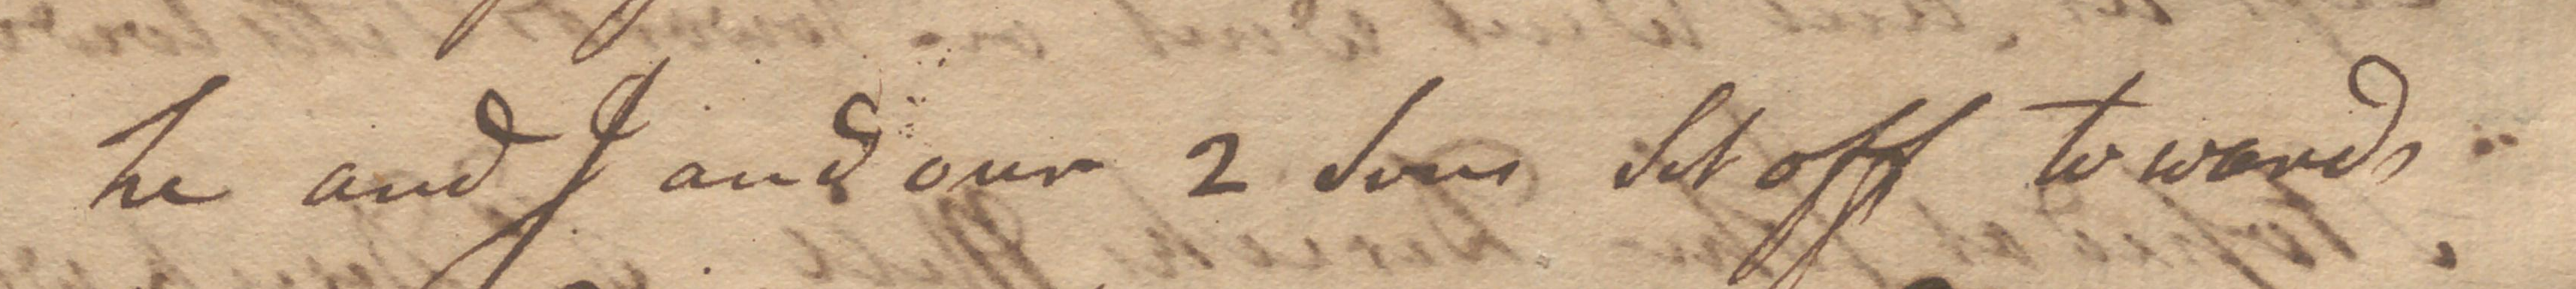he and I and our 2 sons set off towards
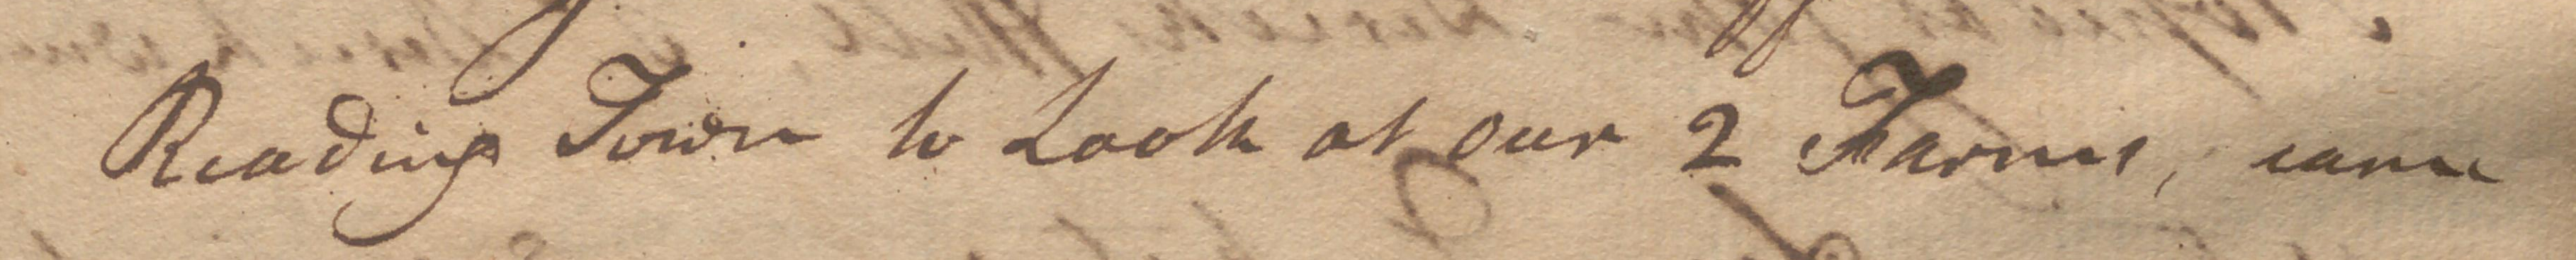Reading Town to Look at our 2 Farms, came
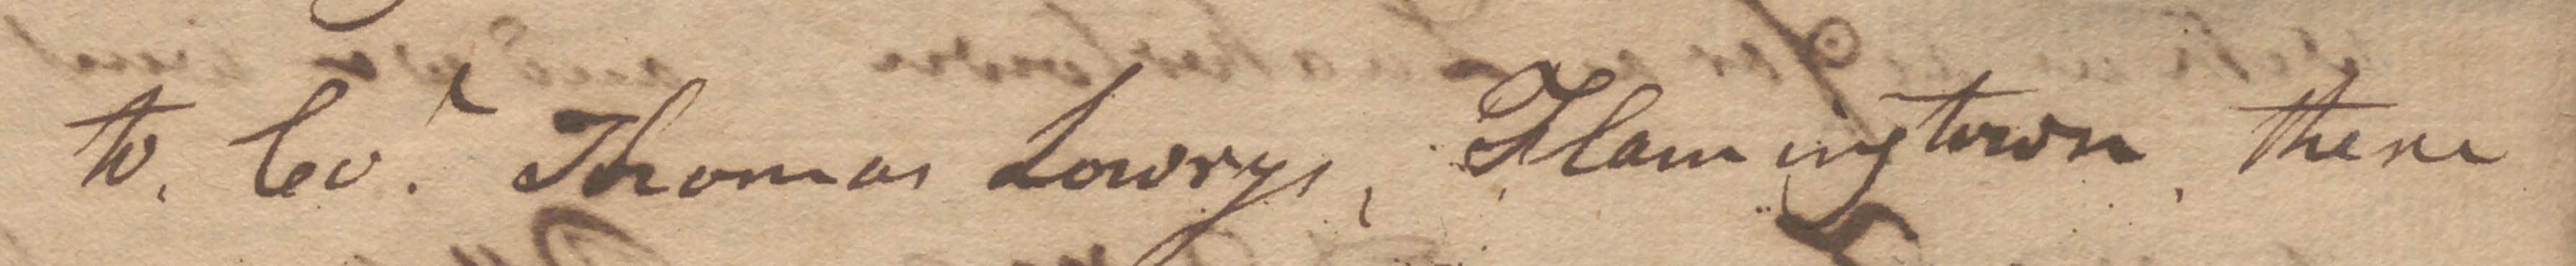to. Co^l. Thomas Lowrys, Flamingtown there
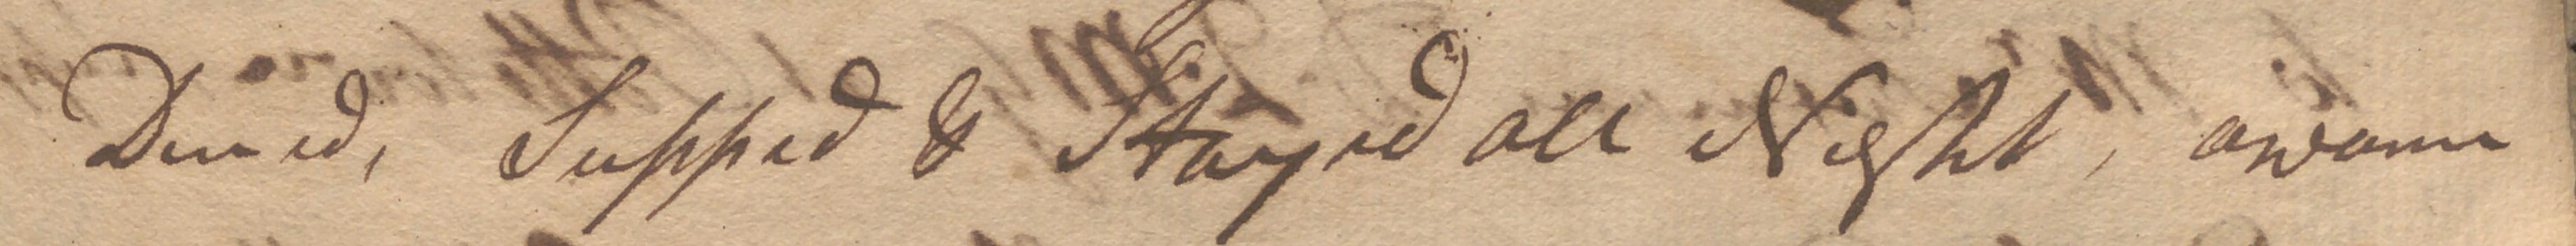Dined, Supped & Stayed all Night, a warm
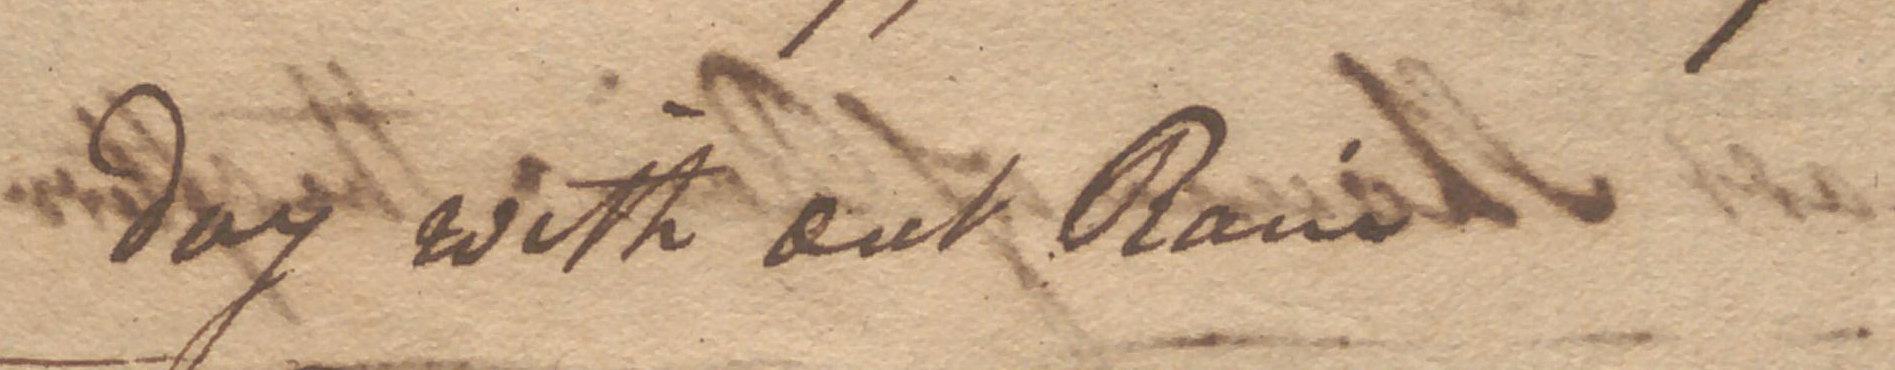day with out Rain
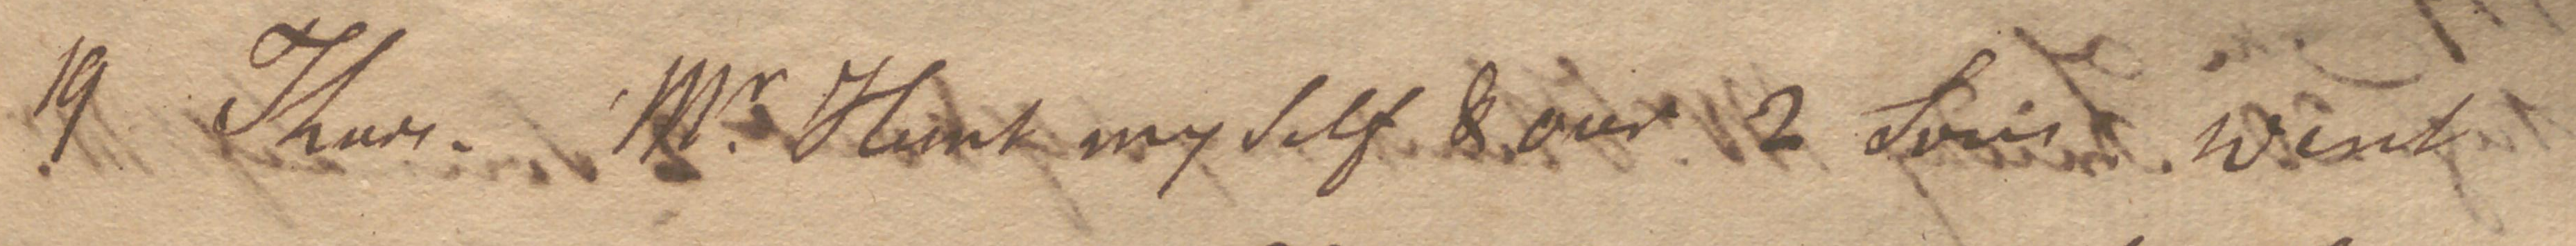19. Thurs. M^r. Hunt my Sslf & our 2 Sons went
